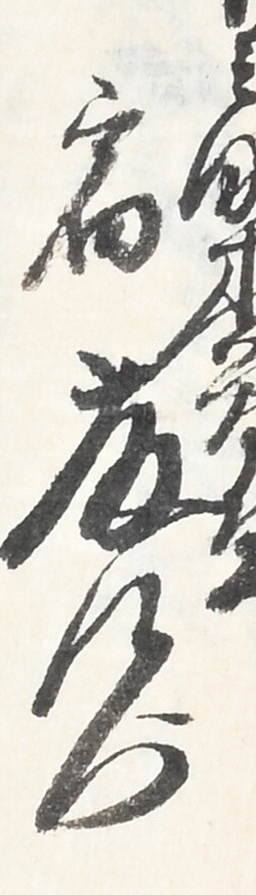宿籐左衛門
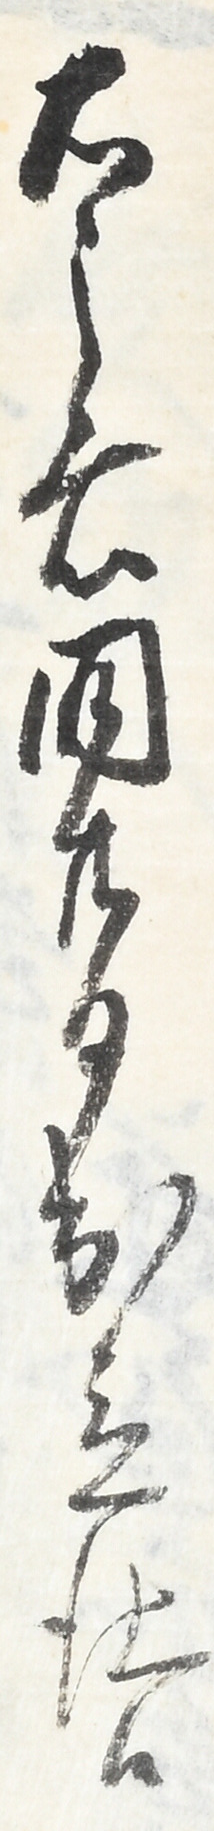右之者同四日出立仕候

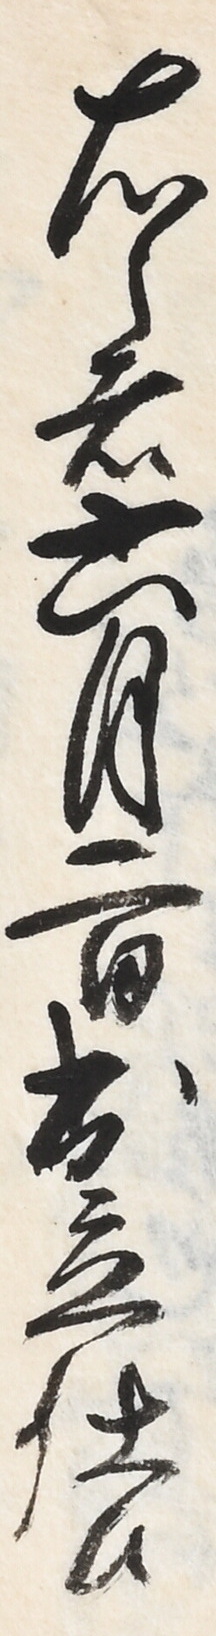右之者六月十二日出立仕候
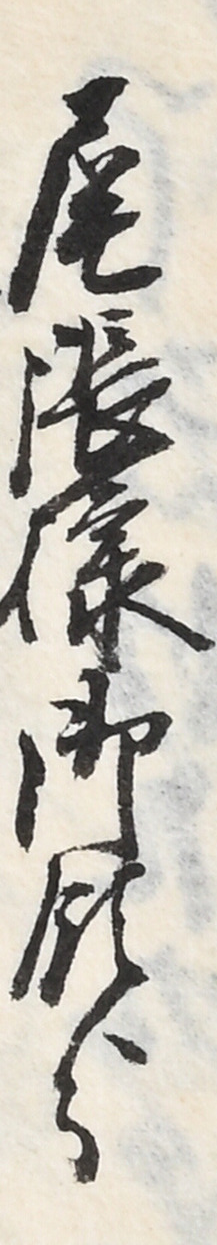尾張様御領分
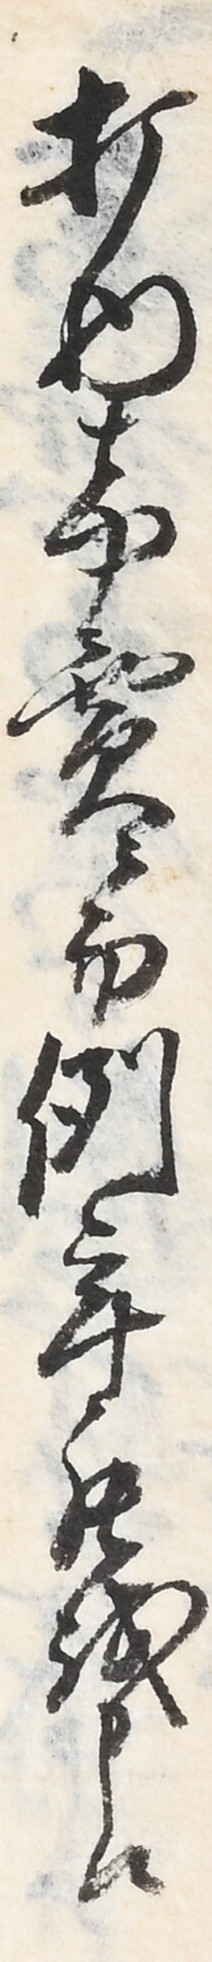打物商売ニ而例年罷越申候
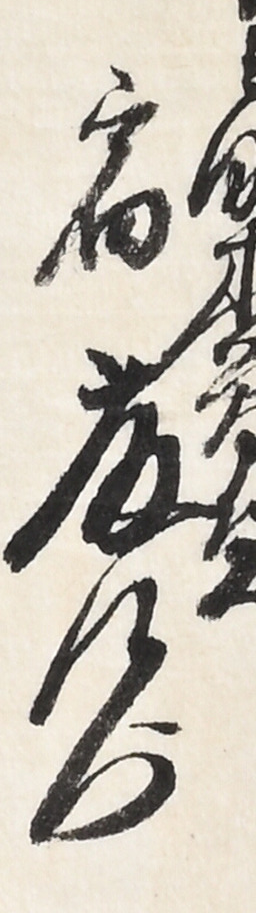宿籐左衛門
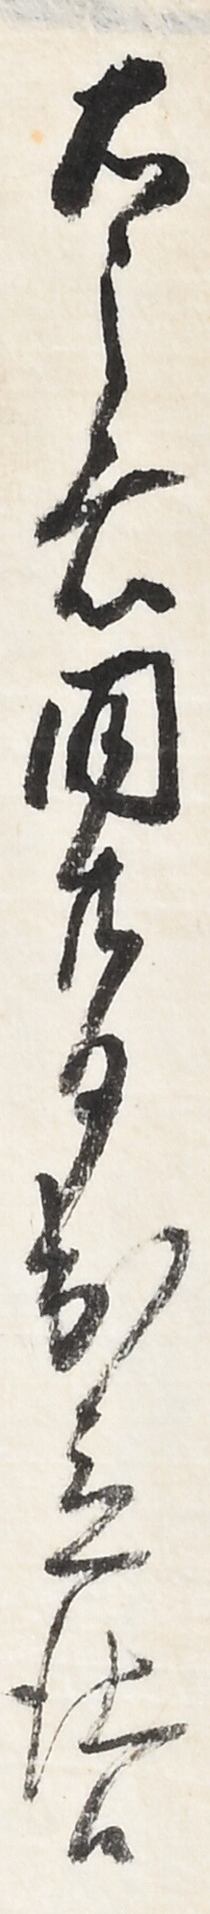右之者同廿日出立仕候
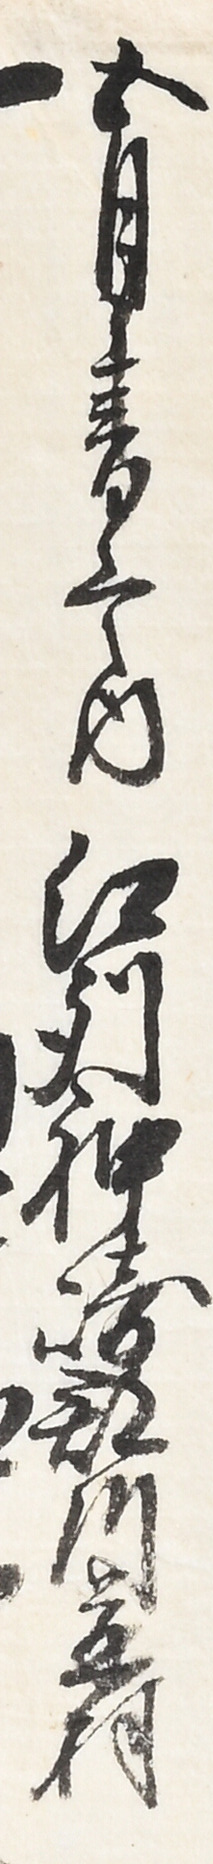五月書上之内江州神崎郡川並村
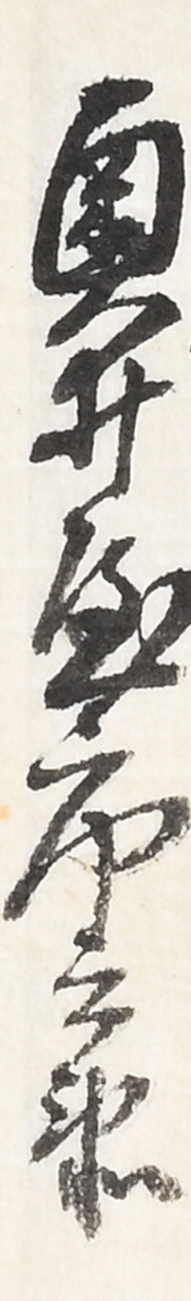一奥井屋市兵衛
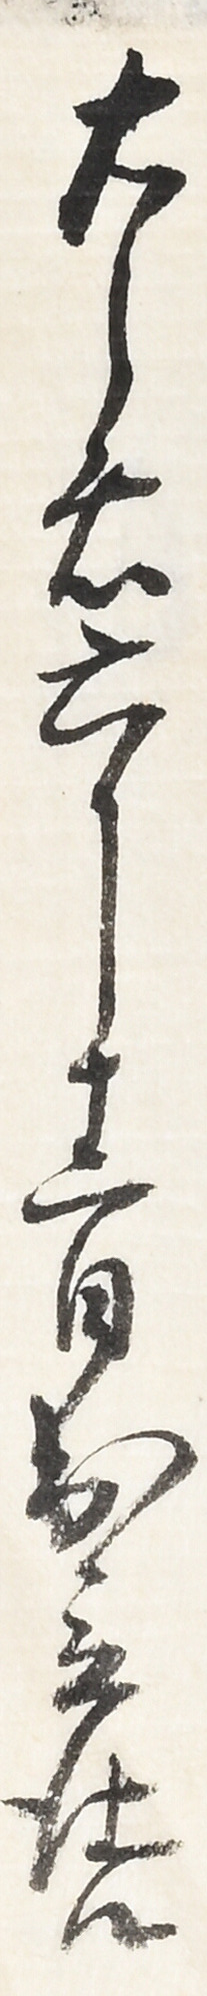右之者六月十二日出立仕候
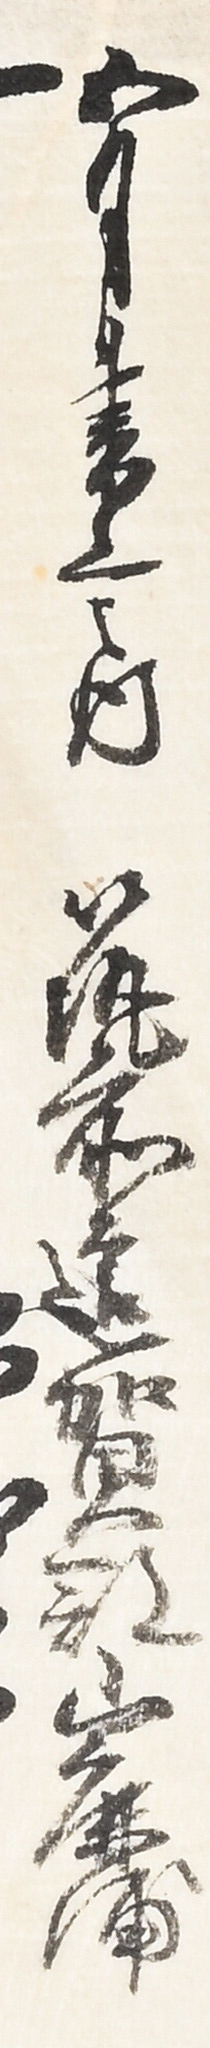五月書上之内筑前遠賀郡山鹿浦
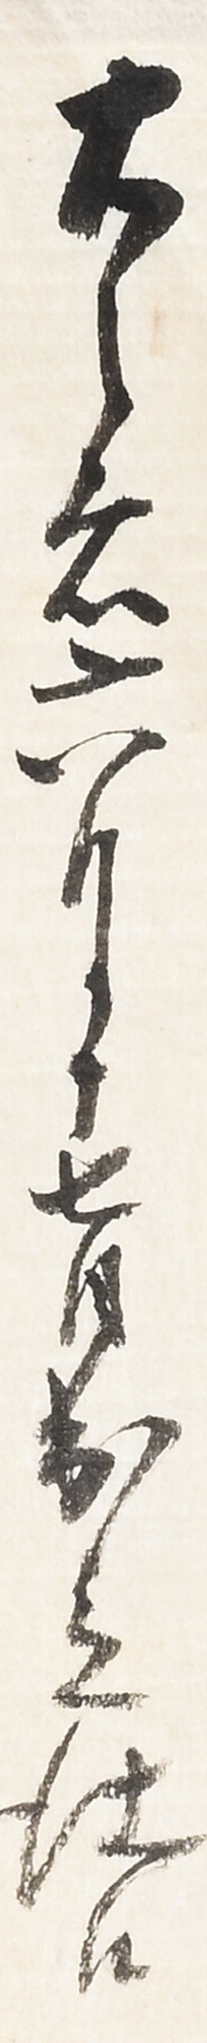右之者六月十七日出立仕候
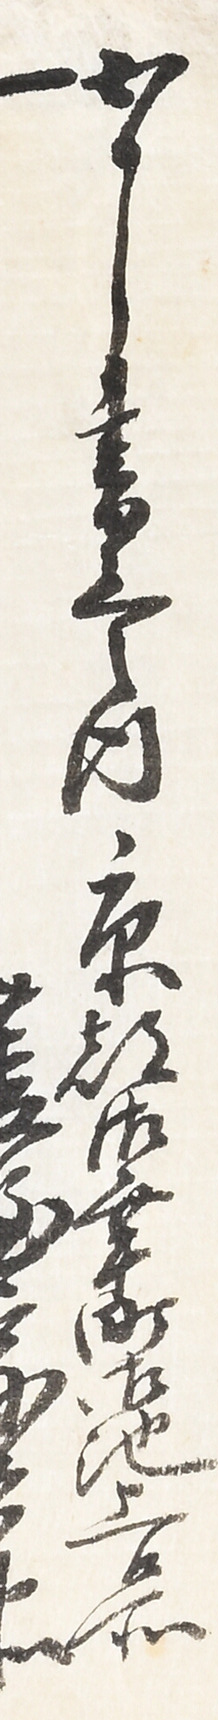五月書上之内京都御幸町御池上ル所
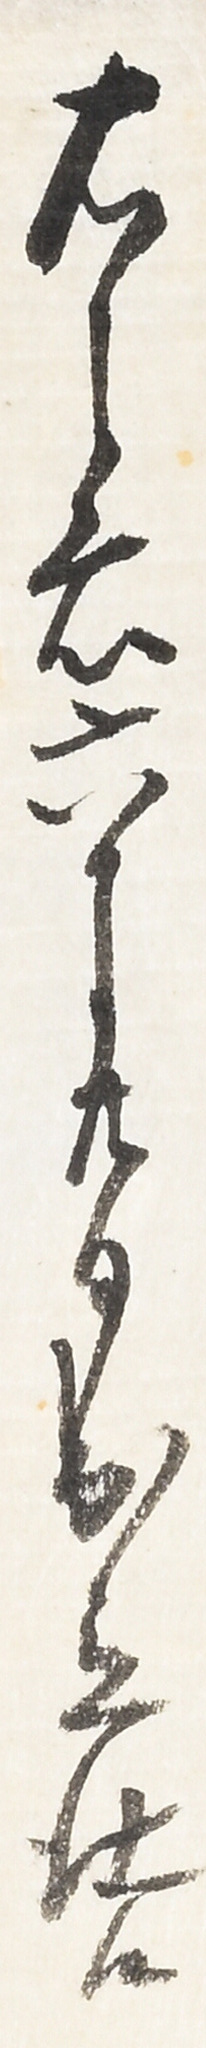右之者六月廿日出立仕候
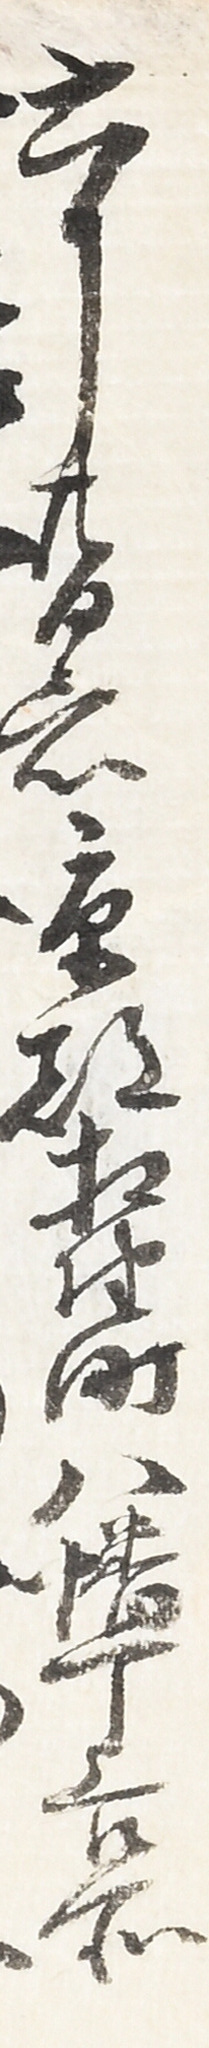六月廿日着京都相野町八幡丁上ル所
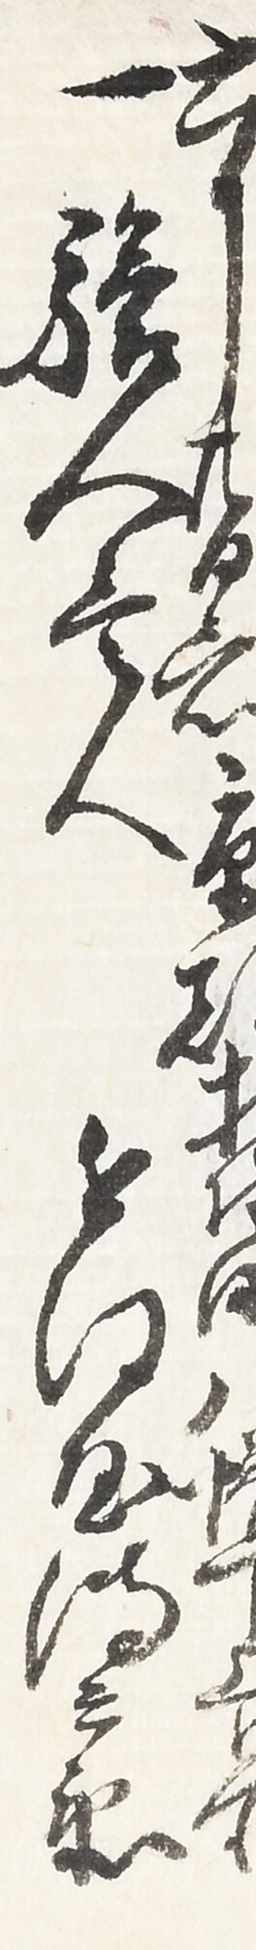一旅人壱人近江屋伝兵衛
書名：旅人泊控帳
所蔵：伊那市立高遠町図書館・合同会社AMANE
